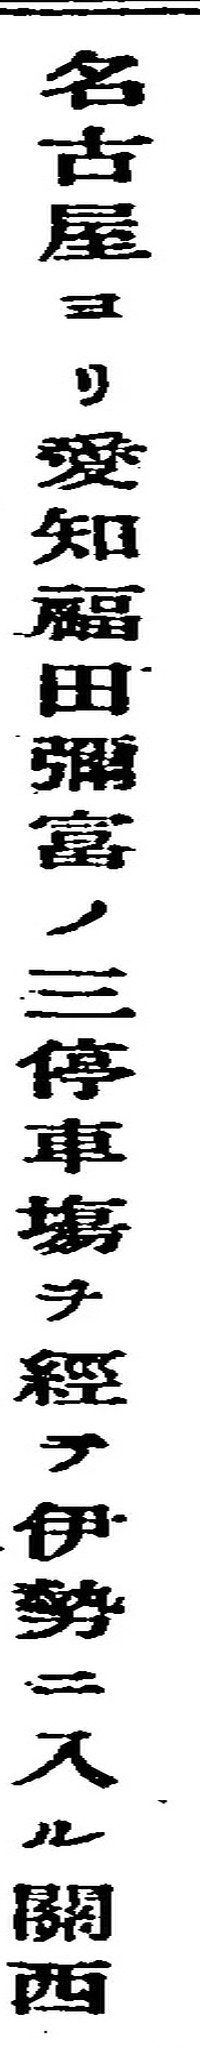關西鐵道名古屋ヨリ愛知福田彌富ノ三停車場ヲ經テ伊勢ニ入ル關西

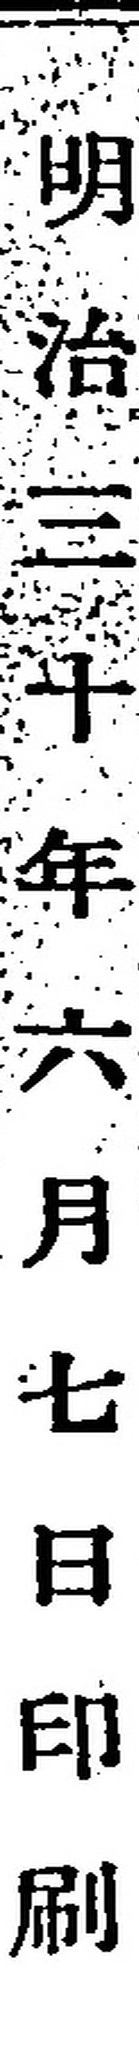明治三十年六月七日印刷
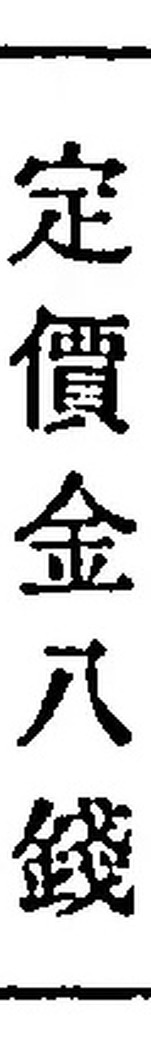定價金八錢
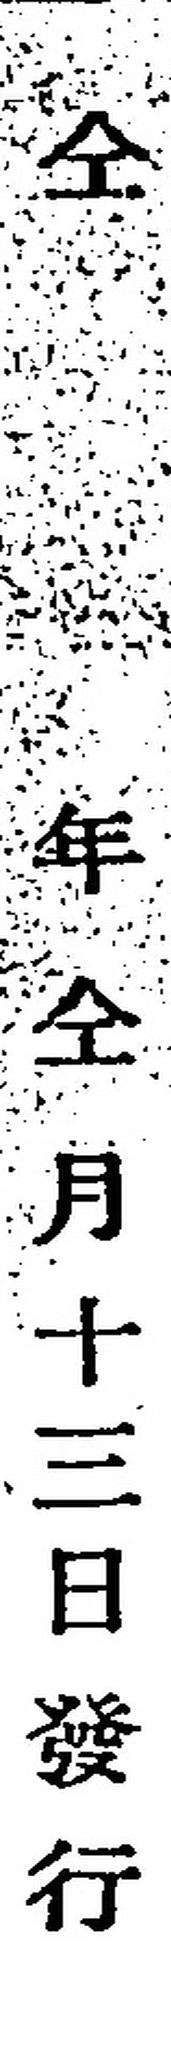仝年仝月十三日發行
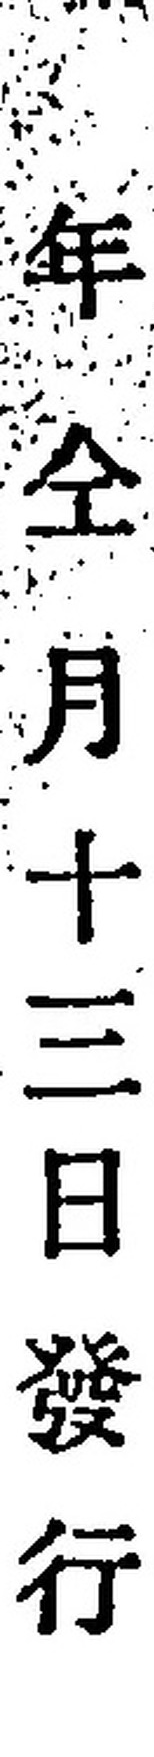仝年仝月十三日發行
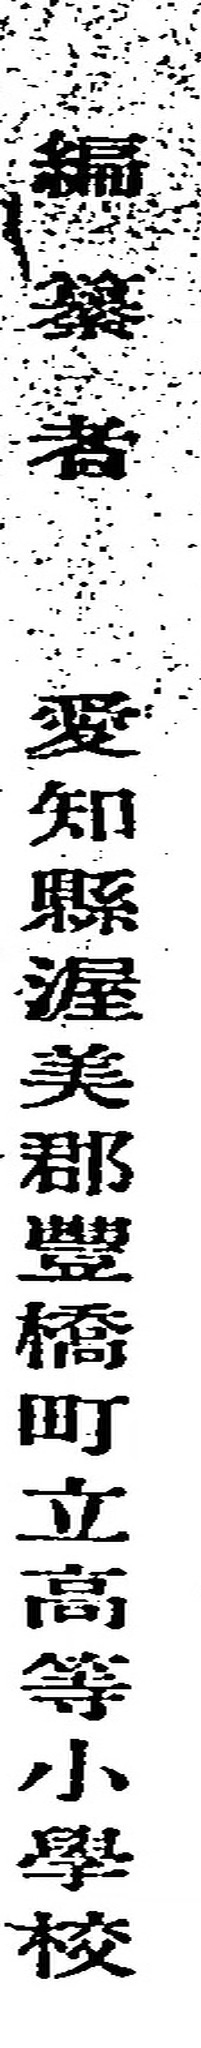編纂者愛知懸渥美郡豐橋町立高等小學校
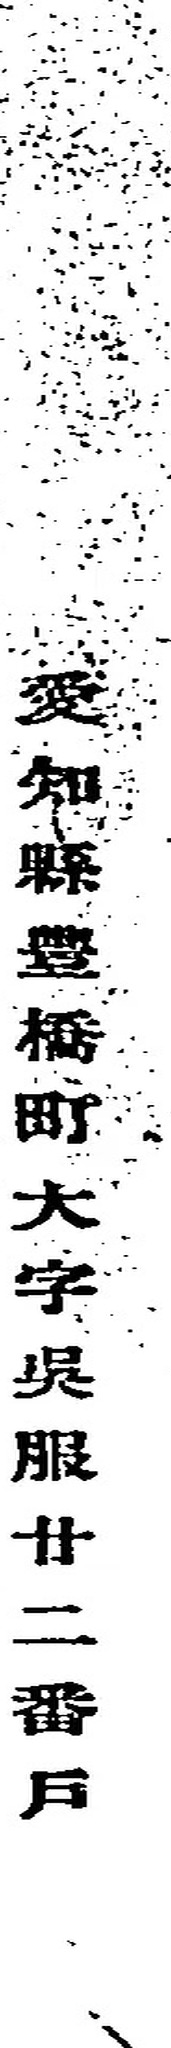愛知懸豐橋町大字呉服廿二番戸
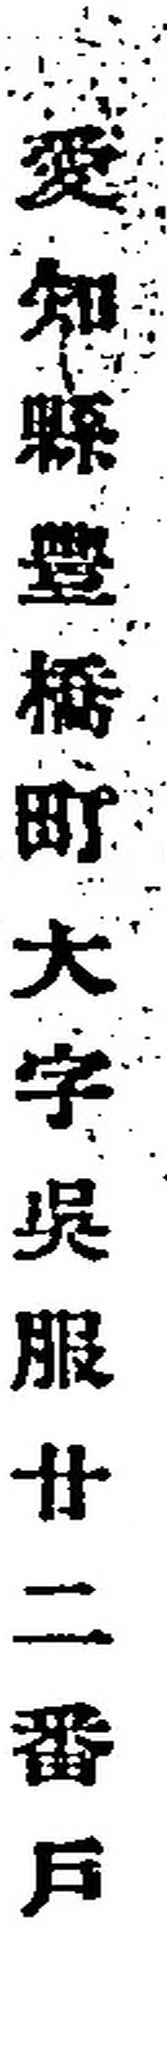愛知懸豐橋町大字呉服廿二番戸
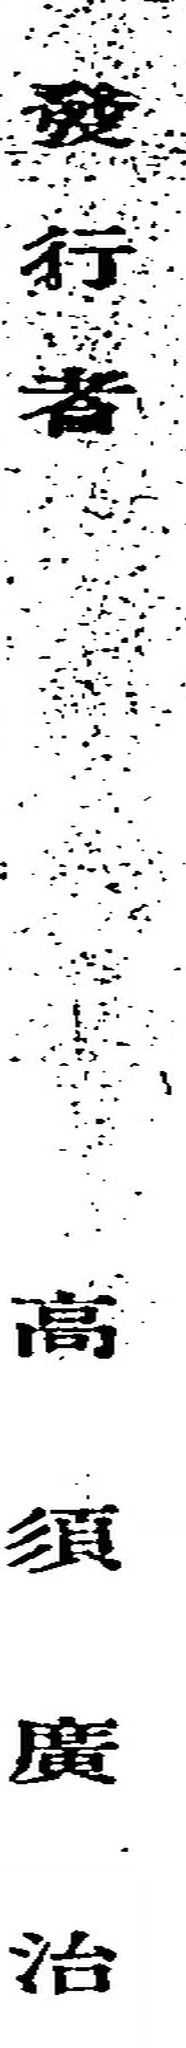發行者高須廣治
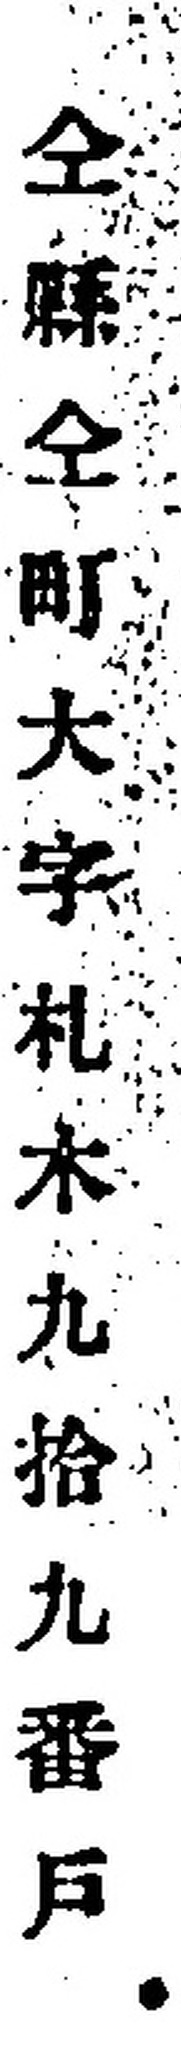仝縣仝町大字札木九拾九番戸
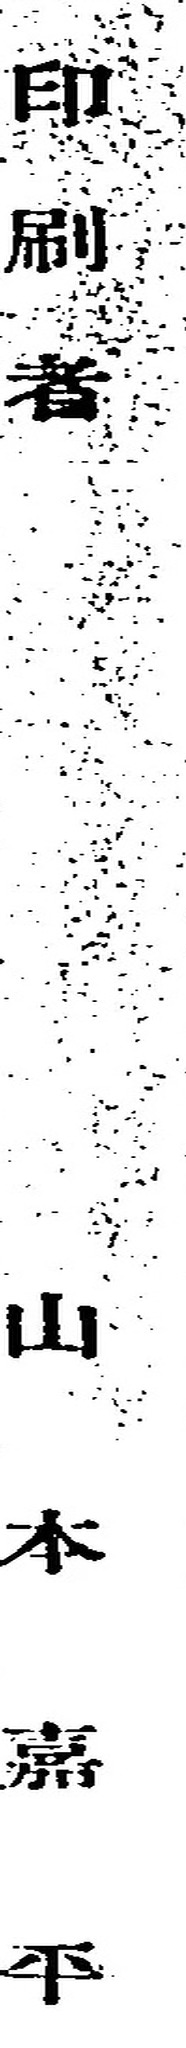印刷者山本嘉平
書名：郷土誌
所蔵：国立国会図書館 National Diet Library, JAPAN
